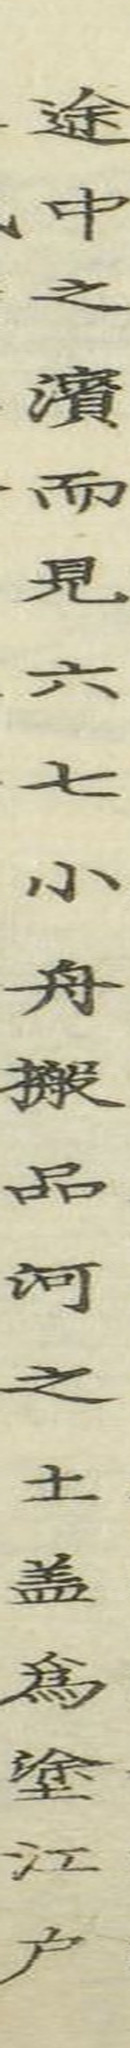途中之濱而見六七小舟搬品河之土盖爲塗江戸
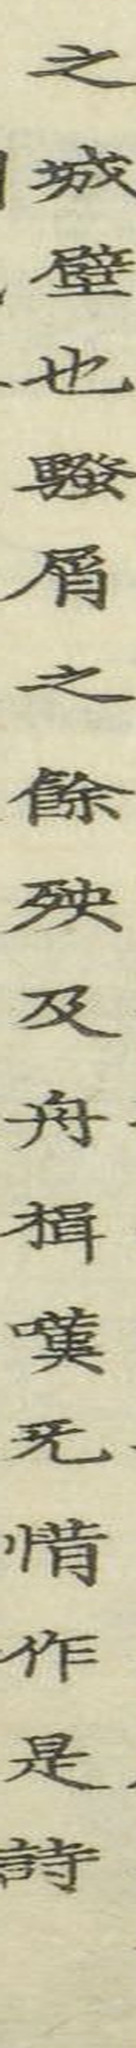之城壁也騷屑之餘殃及舟楫嘆⺛惜作是詩
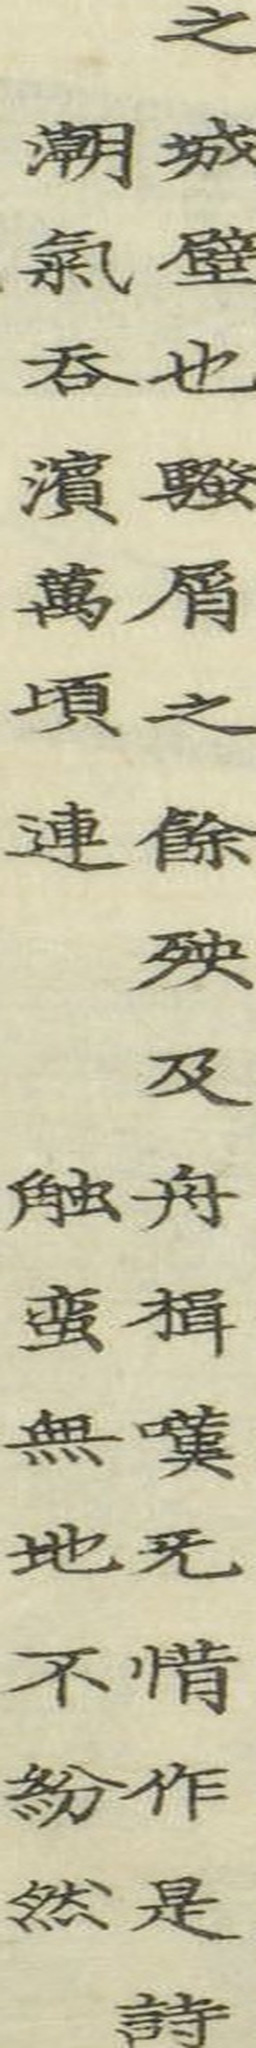潮氣吞濵萬頃連触蛮無地不紛然
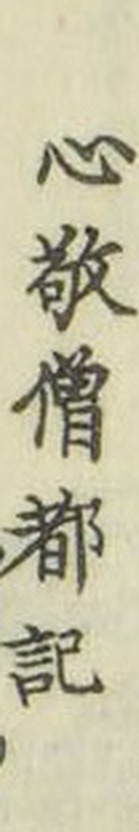心敬僧都記
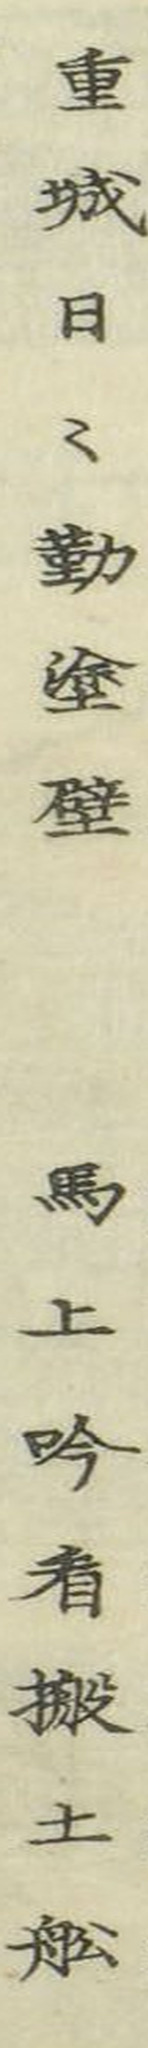重城日々勤塗壁馬上吟看搬土舩

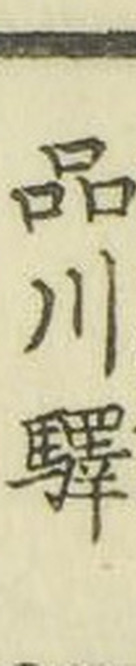品川驛
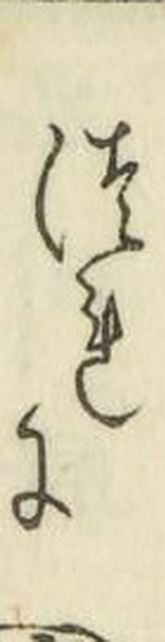つれに
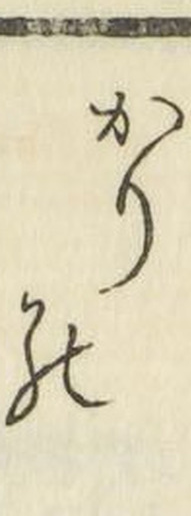かりの

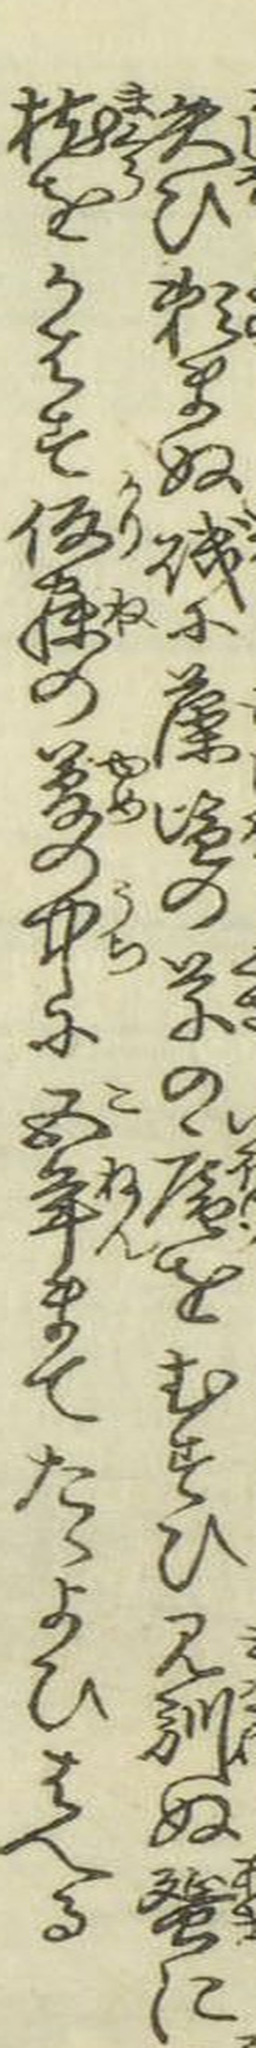枕をかはす仮寐の夢の中に五年まてたゝよひたへる
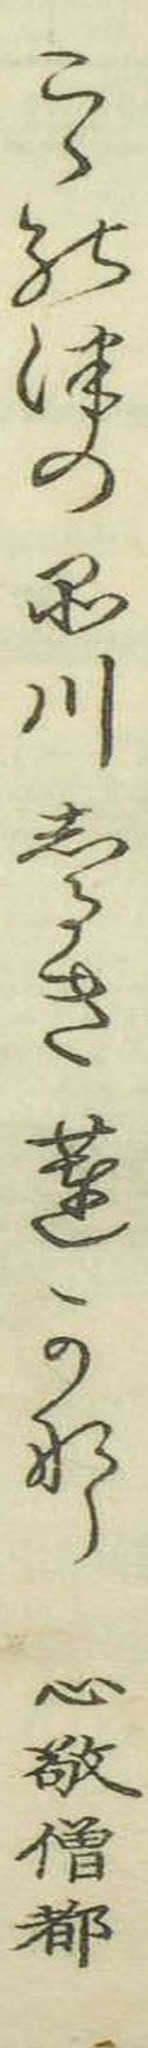こゝのつの品川しるき蓮かなし心敬僧都
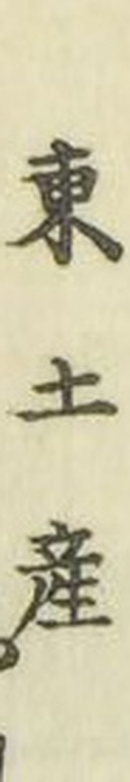東土産
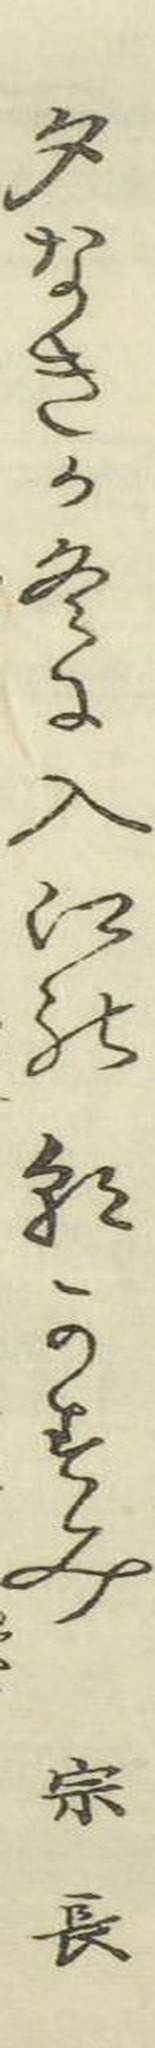夕なきか冬に入江の朝かすみ宗長
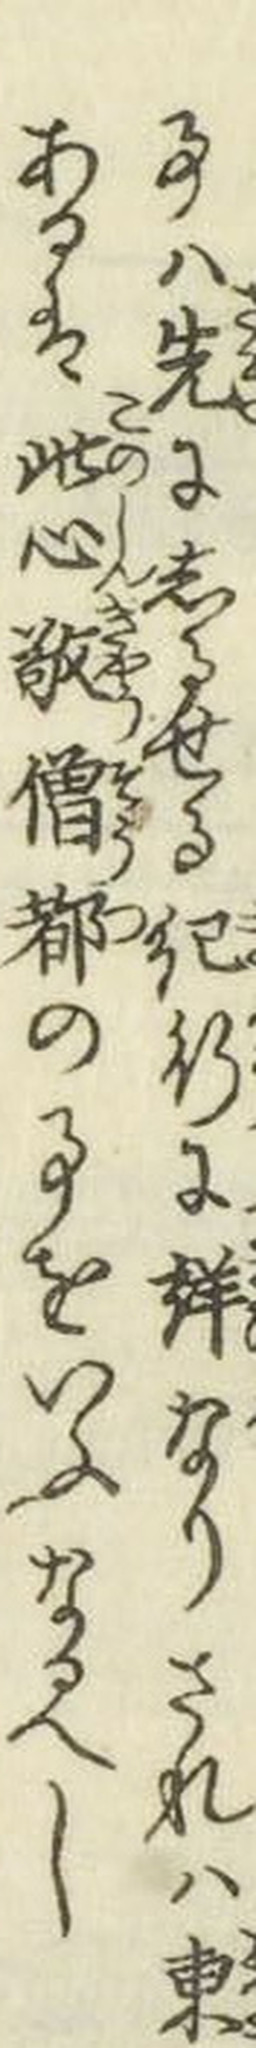あるは此心敬僧都の事をいふなるへし
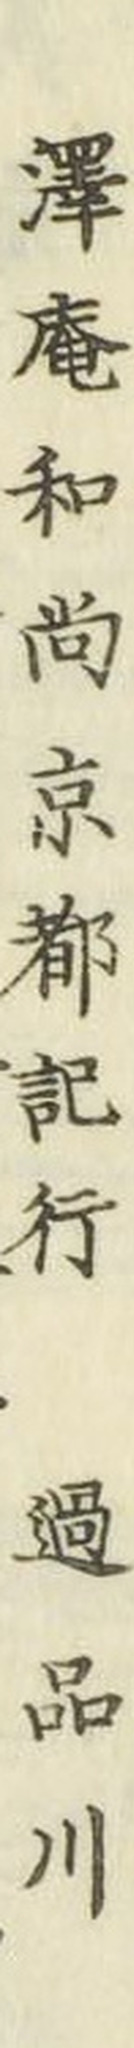澤庵和尚京都記行過品川
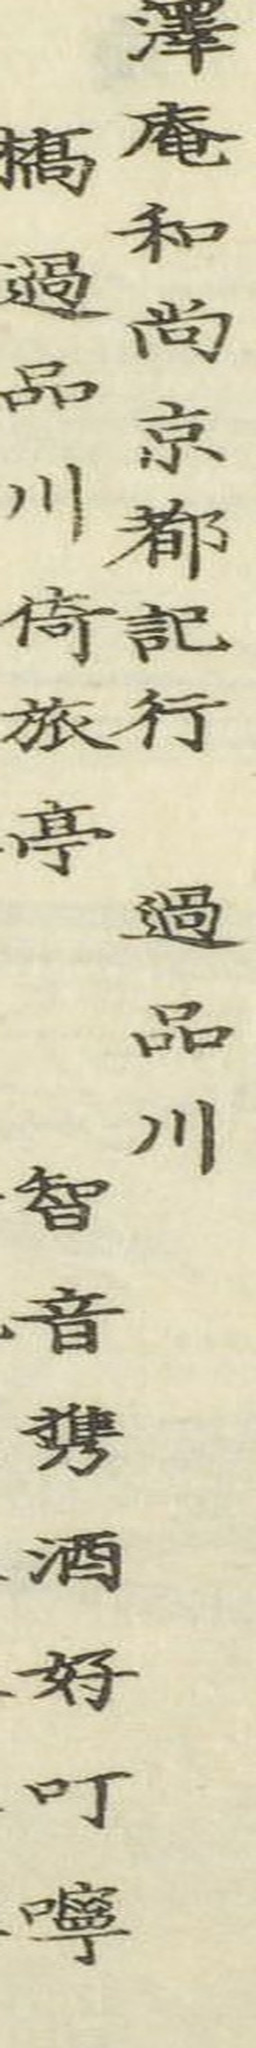橋過品川倚旅亭智音携酒好叮嚀
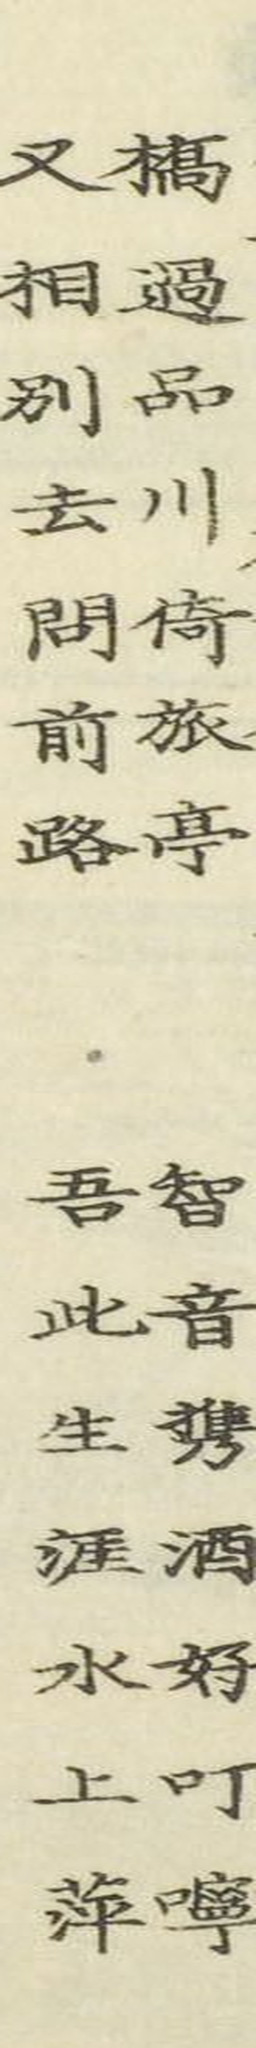又相別去問前路吾此生涯水上萍
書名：江戸名所図会 20巻 巻之4
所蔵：東京学芸大学教育コンテンツアーカイブ
